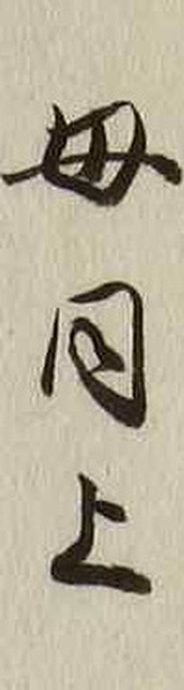母同上
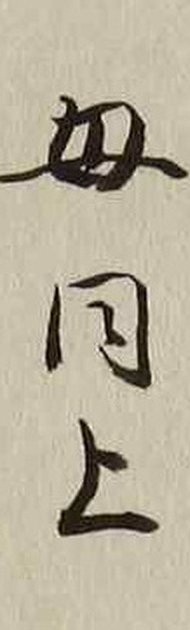母同上
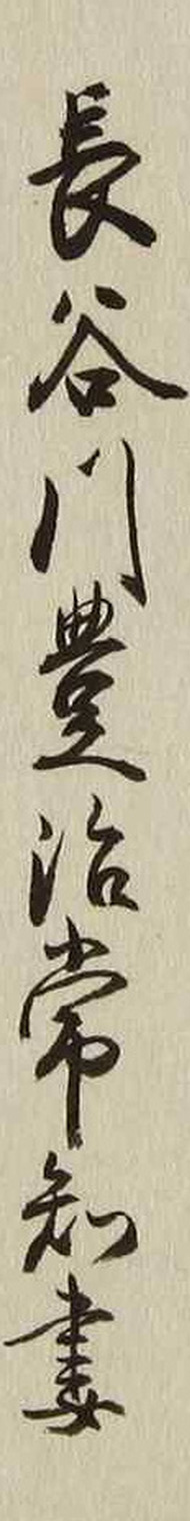女長谷川豊治常知妻
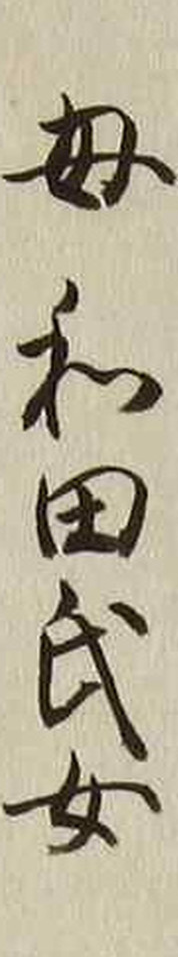母和田氏女
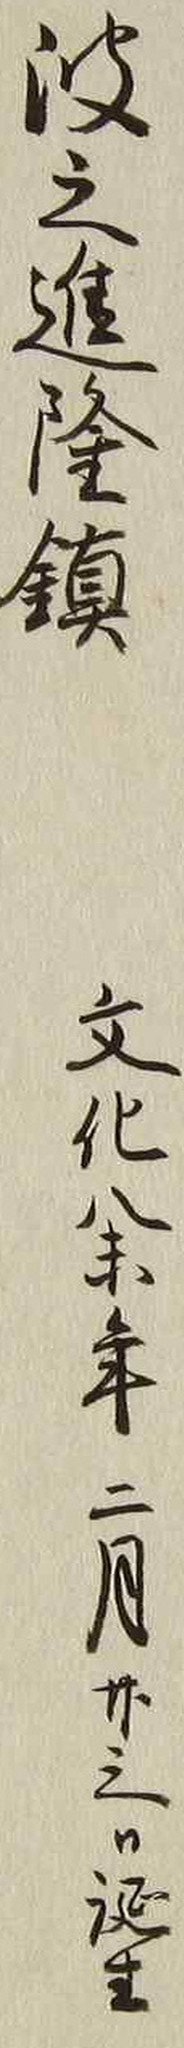波之進隆鎮文化八未年二月廿三日誕生
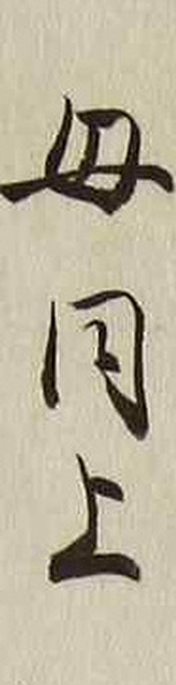母同上
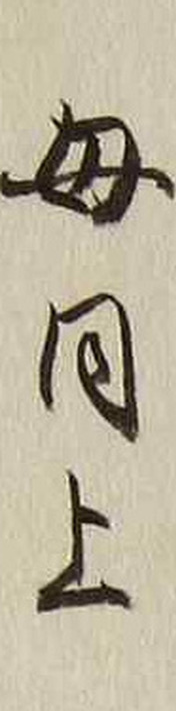母同上
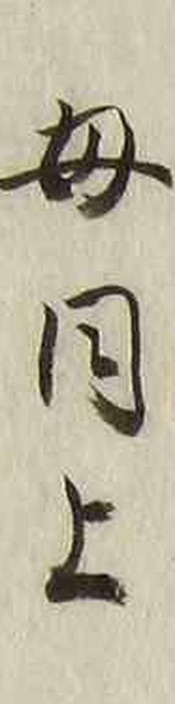母同上

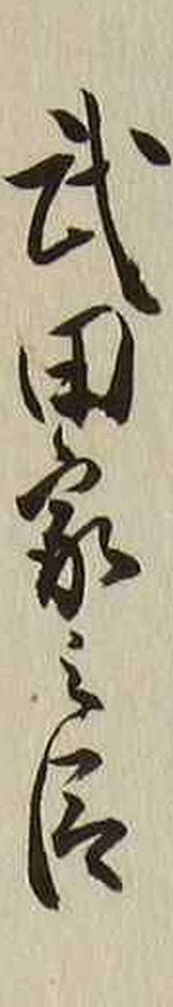武田家之臣
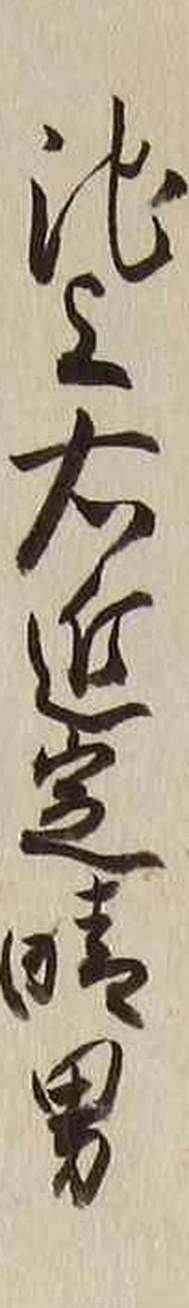池上右近定晴男
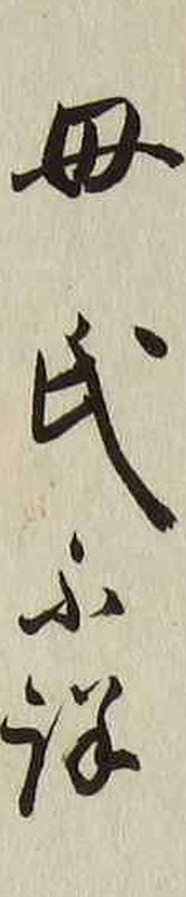母氏不詳
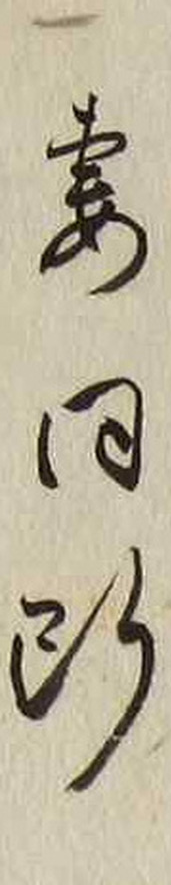妻同断
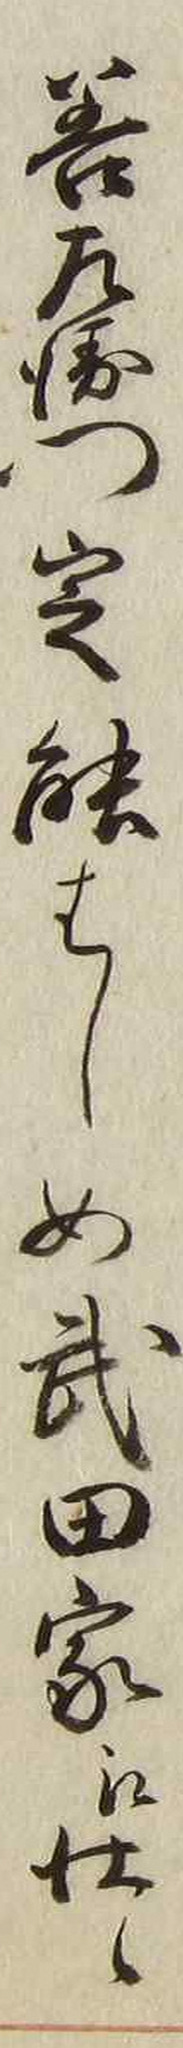善左衛門定能はしめ武田家江仕候
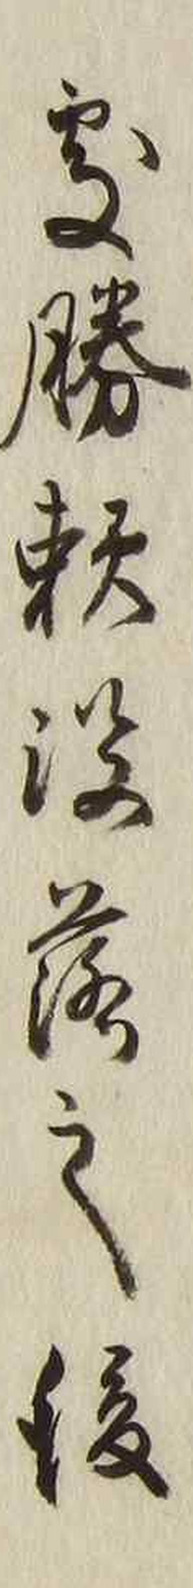処勝頼没落之後

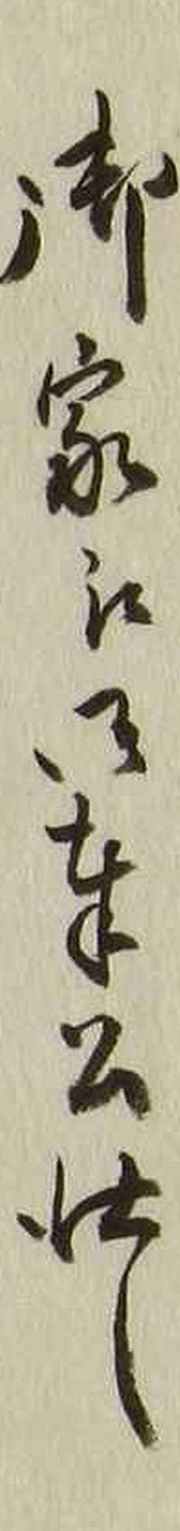御家江御奉公仕候
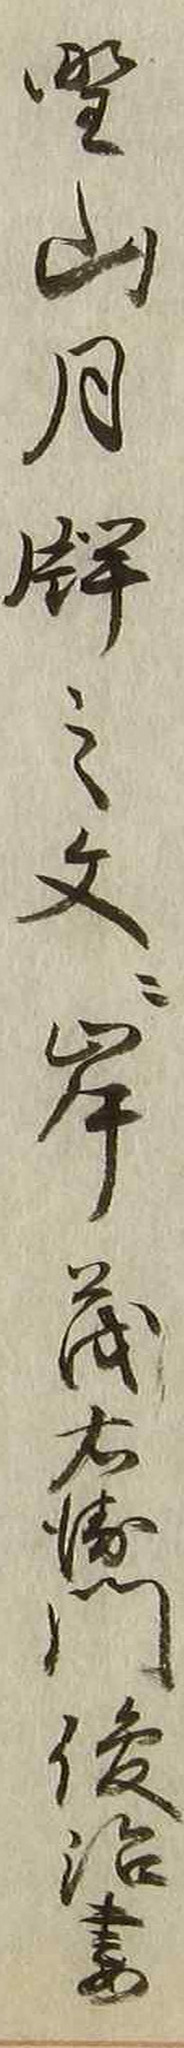野山月牌之文ニ岸茂右衛門俊治妻
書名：諸士系譜　巻之15　い之部15
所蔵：会津若松市立会津図書館
